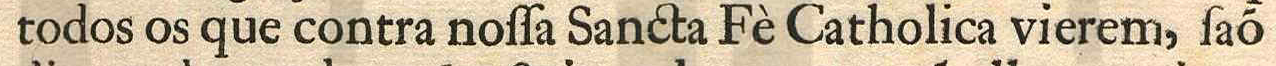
todos os que contra nossa Sancta Fè Catholica vierem, saõ
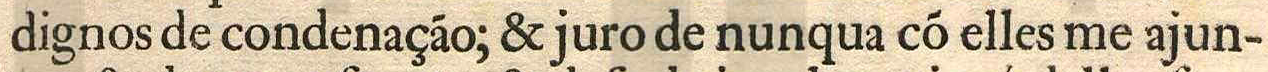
dignos de condenação; & juro de nunqua cō elles me ajun
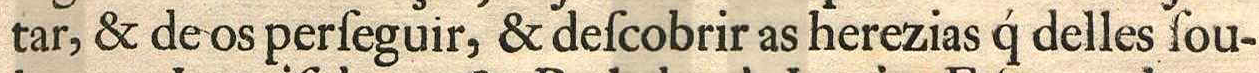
tar, & de os perseguir, & descobrir as herezias q̄ delles sou
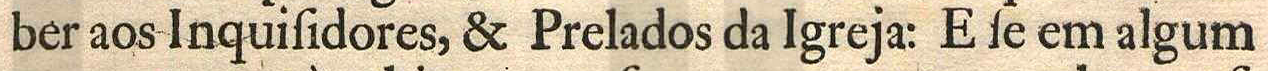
ber aos Inquisidores, & Prelados da Igreja: E se em algum
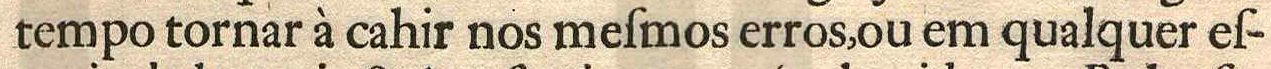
tempo tornar à cahir nos mesmos erros, ou em qualquer es
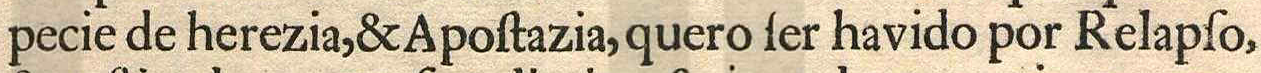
pecie de herezia, & Apostazia, quero ser havido por Relapso,
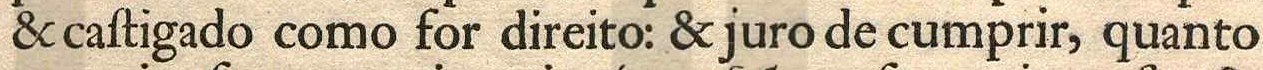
& castigado como for direito: & juro de cumprir, quanto
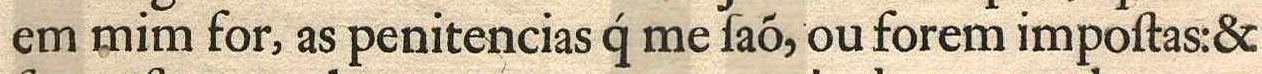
em mim for, as penitencias q̄ me saõ, ou forem impostas: &
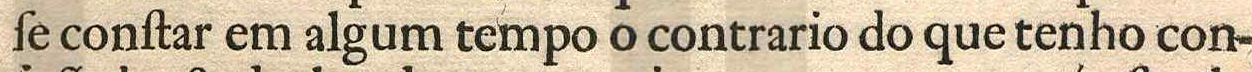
se constar em algum tempo o contrario do que tenho con
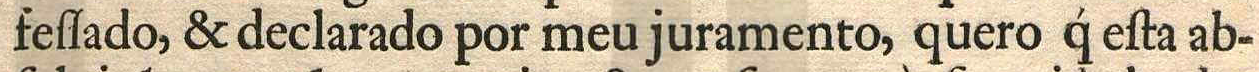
fessado, & declarado por meu juramento, quero q̄ esta ab
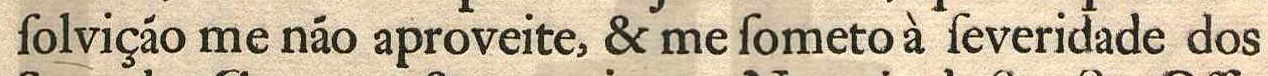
solvição me não aproveite, & me someto à severidade dos
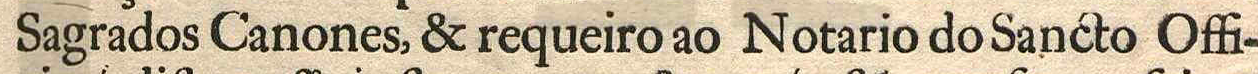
Sagrados Canones, & requeiro ao Notario do Sancto Offi
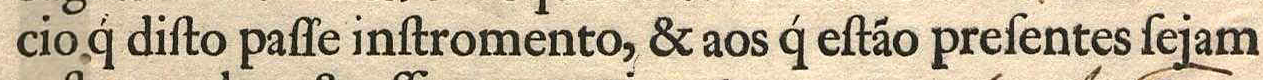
cio q̄ disto passe instromento, & aos q̄ estão presentes sejam
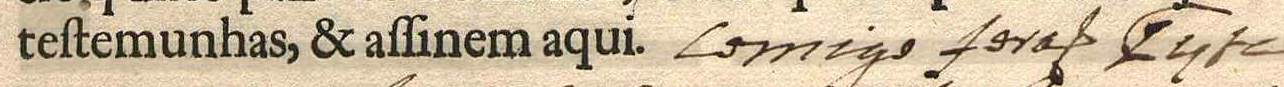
testemunhas, & assinem aqui. comigo foraõ Teste
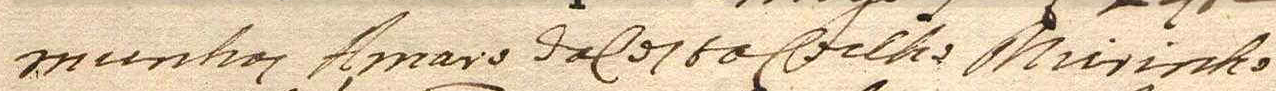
munhas Amaro da Costa Coelho Meirinho
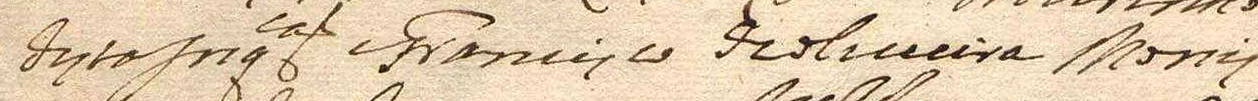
desta Jnqçaõ e Francisco de oliueira Monis
